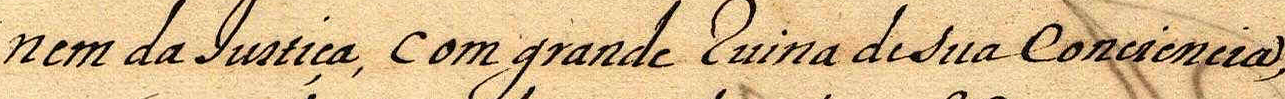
nem da Iustiça, com grande ruina de sua conciencia,
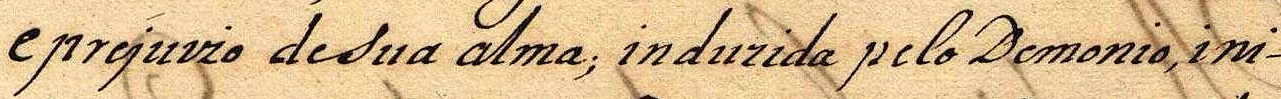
e prejuizo de sua alma; induzida pelo Demonio, ini
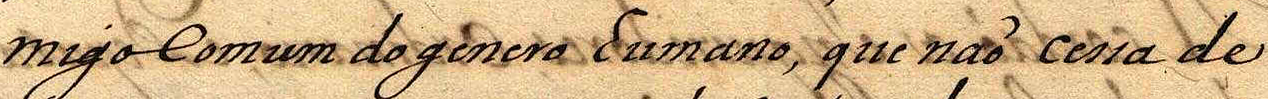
migo Comum do genero humano, que não cessa de
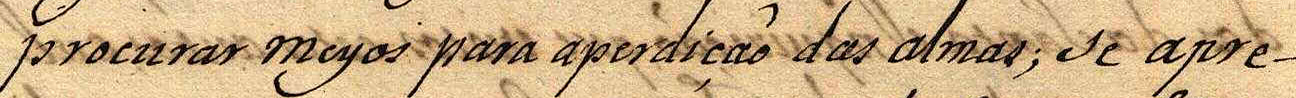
procurar meyos para a perdição das almas; se apre
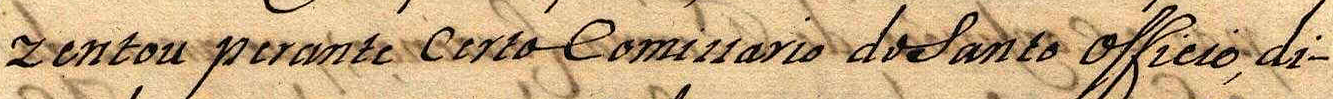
zentou perante Certo Comissario do Santo officio, di
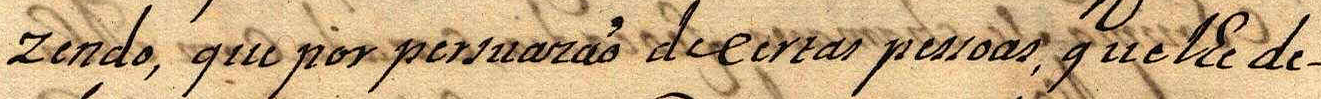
zendo, por persuazaõ de certas pessoas, que lhe de
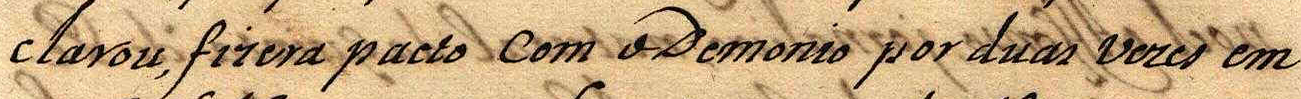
clarou, fizera pacto com o Demonio por duas vezes em
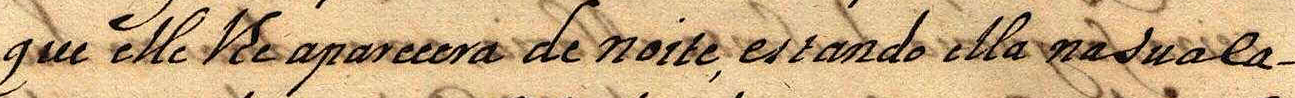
que elle lhe aparecera de noite, estando ella na sua ca
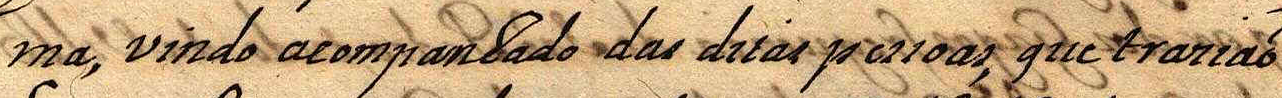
ma, vindo acompanhado das ditas pessoas, que traziaõ
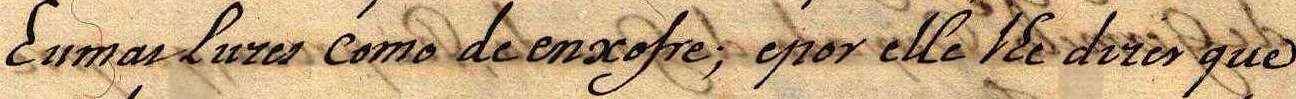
humas luzes como de enxofre; e por elle lhe dizer que
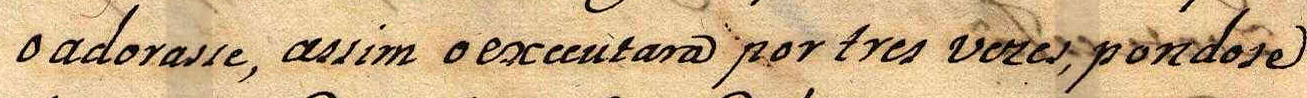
o adorasse, assim o executara por tres vezes, pondo se
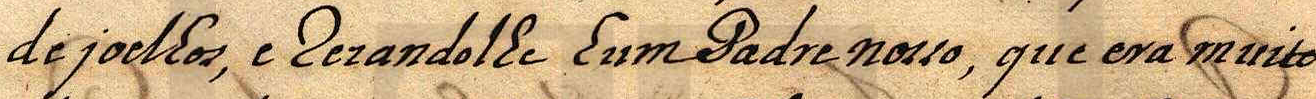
de joelhos, e rezando lhe hum Padre nosso, que era muito
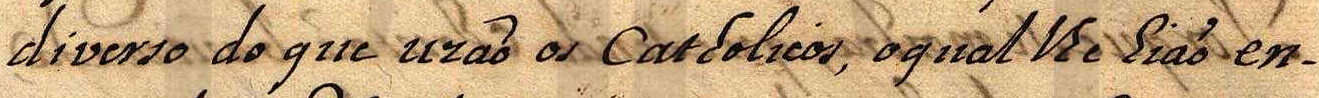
diverso do que uzão os Catholicos, o qual lhe hiaõ en
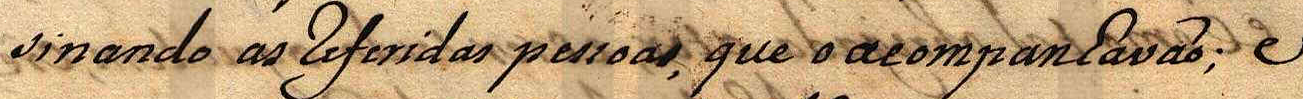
sinando as referidas pessoas, que o acompanhavaõ; e
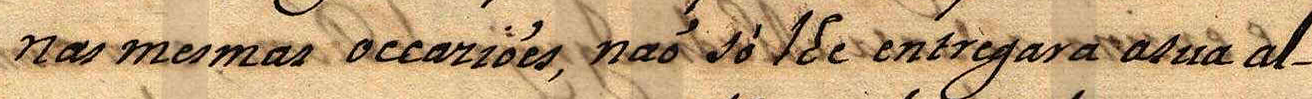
nas mesmas occazioẽs, naõ só lhe entregara a sua al
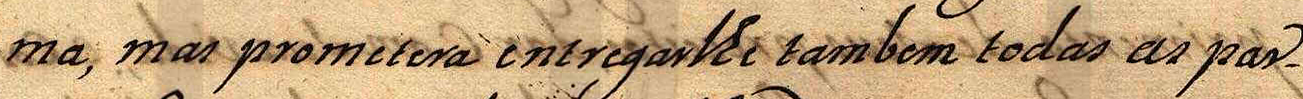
ma, mas prometera entregar lhe tambem todas as par
